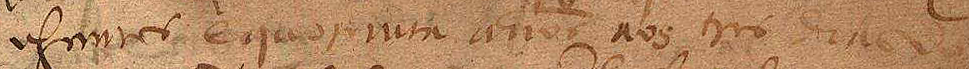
nhemtos e quoremta an̄os aos tres dias do
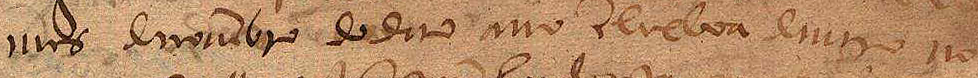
mes de nouēbro do dito ano ē lixboa demtro no
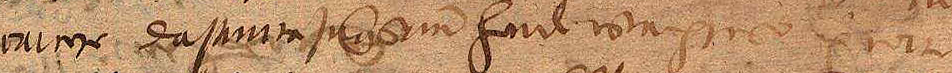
carcere da samta Jnq̄sycā honde esta preso po corte
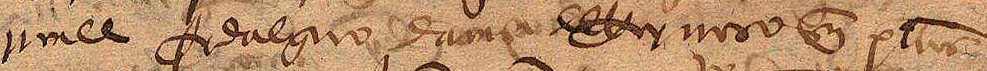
rreall fydalguo da casa del Rey nosso s̄r pl̄los
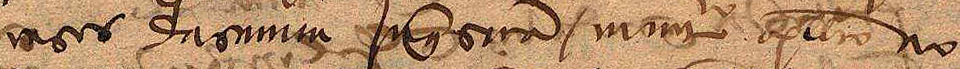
casos da samta Jnq̄sjcā / eu notro āpllco ao
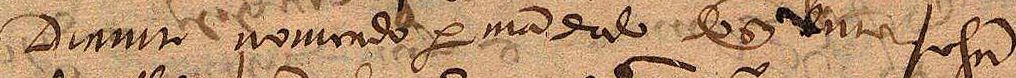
Diamte nomeado ꝑ mādado do s̄r doutor Johā
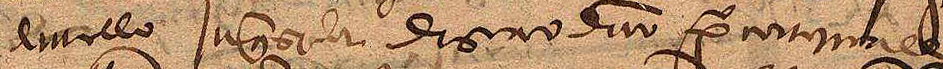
de mello Jnq̄sydor dise ao dito p̄o corte rreall
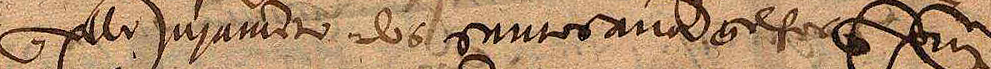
q̄ pl̄lo Juramēto dos santos auāgelhos q̄ p̄mro
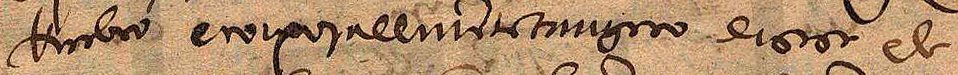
Recebeo e corporallmēte tamgeeo disese e de
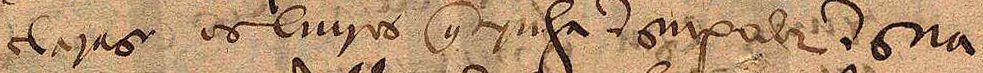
clarase os liuros q̄ tynha ē seu poder ē sua
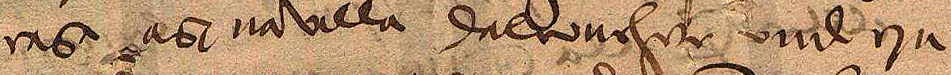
casa asj na villa dalcouchete onde era
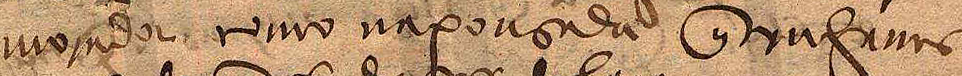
morador como na pousada q̄ tynha nes
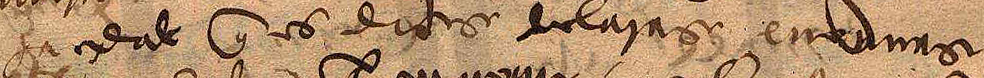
ta cydade q̄ os disese declarase e nomease
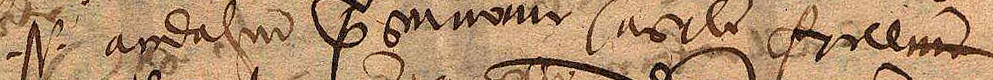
.ss. a cada huū p̄o seu nome / asy bē fyellmē
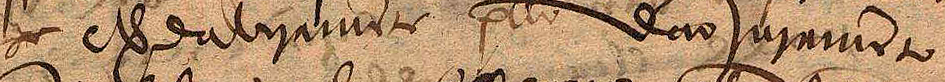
te e ꝟdadeiramēte p̄llo dito Juramēto
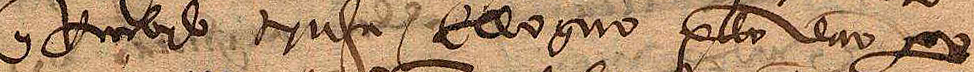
q̄ Reçebydo tynha / E lloguo p̄llo dito ꝑo
